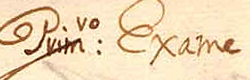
Primro: Exame
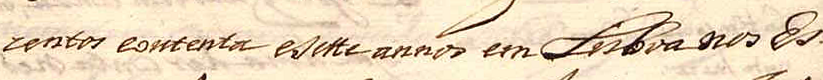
centos e outenta e sette annos em Lisboa nos Es
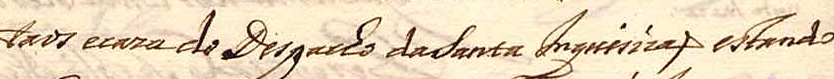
taos e caza do Despacho da Santa Inquisiçaõ estando
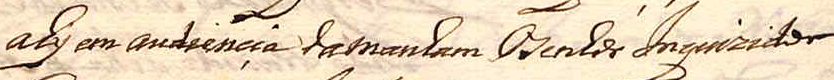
ahy em audiençia da manham O senhor Inquizidor
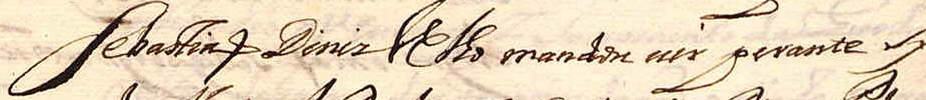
Sebastião Diniz Velho mandou uir perante sy
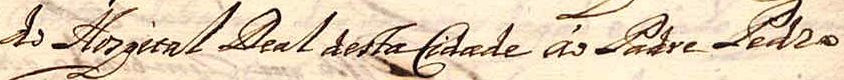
do Hospital Real desta Cidade ao Padre Pedro
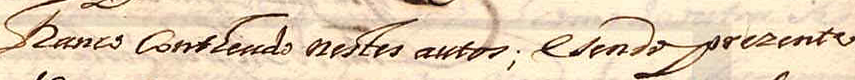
Franco contheudo nestes autos; e sendo prezente
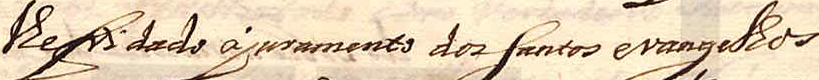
lhe foi dado a juramento dos Santos evangelhos
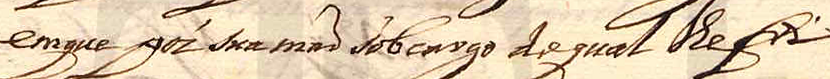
em que poz sua maõ sob cargo do qual lhe foi
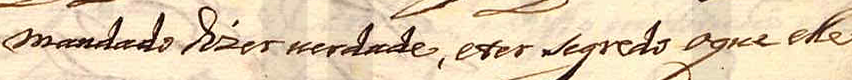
mandado dizer uerdade, e ter segredo o que elle
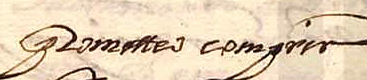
prometteo comprir.
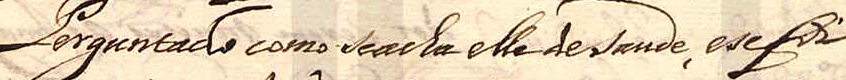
Perguntado como se acha elle de saude, e se foi
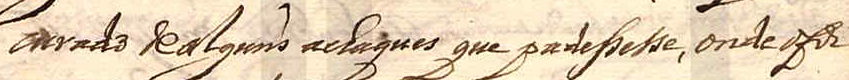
curado de alguns̄ achaques que padessesse, onde o foi
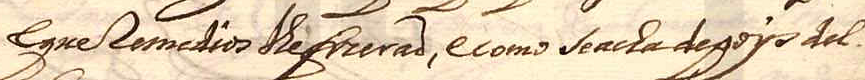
e que Remedios lhe fizeraõ, e como se acha depoys del
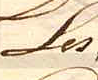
Les?
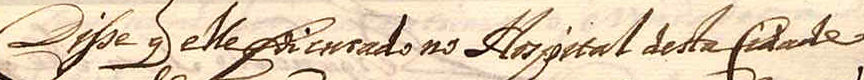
Disse q̄ elle foi curado no Hospital desta Cidade
